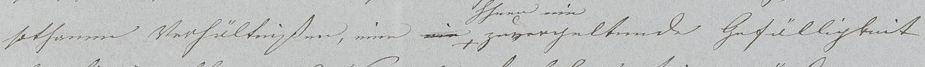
sothanen Verhältnissen, eine niexxIhnen nie zuvergeltende Gefälligkeit
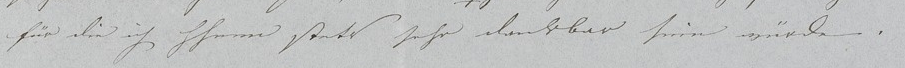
für die ich Ihnen stets sehr dankbar sein würde.
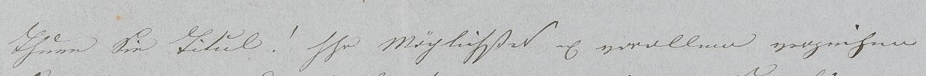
Thuen Sie Titul! Ihr Möglichstes & vorallem verzeihen
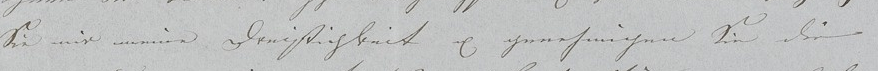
Sie mir meine Dreistigkeit & genehmigen Sie die
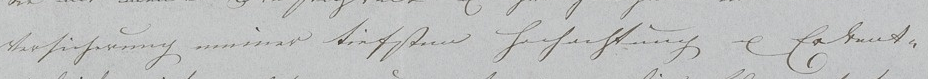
Versicherung meiner tiefsten Hochachtung & Erkent-
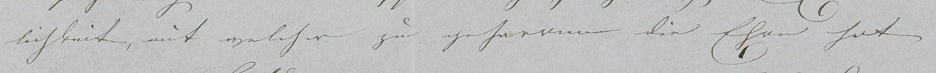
lichkeit, mit welcher zu geharren die Ehre hat
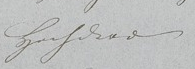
Hochdero
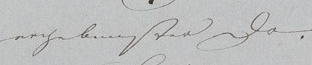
ergebenster Dr.
